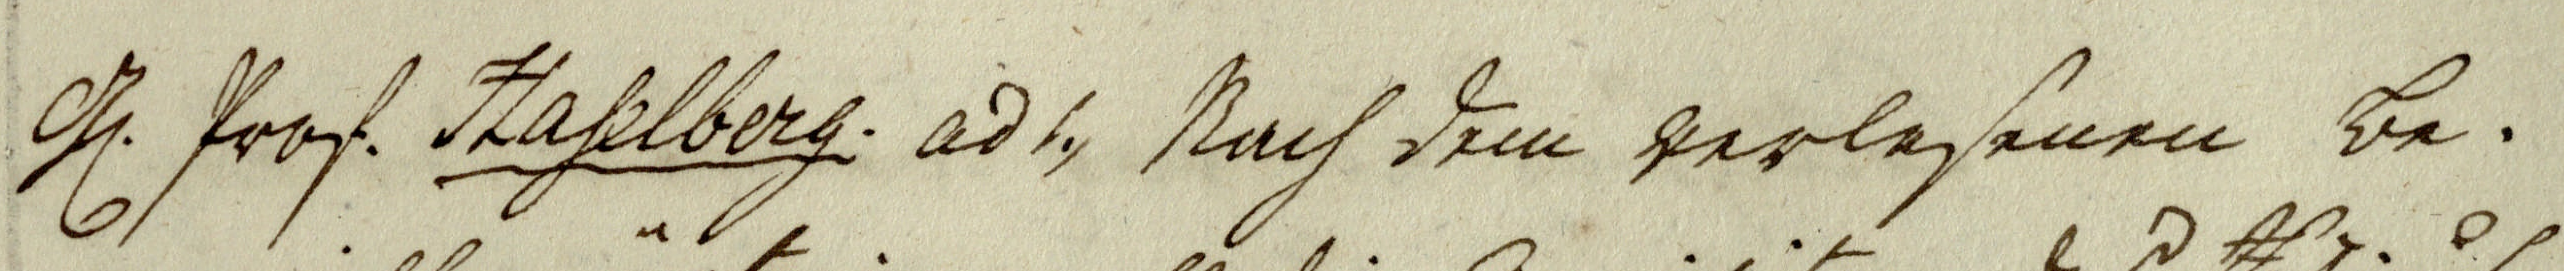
dh. Prof. Haselberg. ad 1., Nach dem verlesenen Be¬
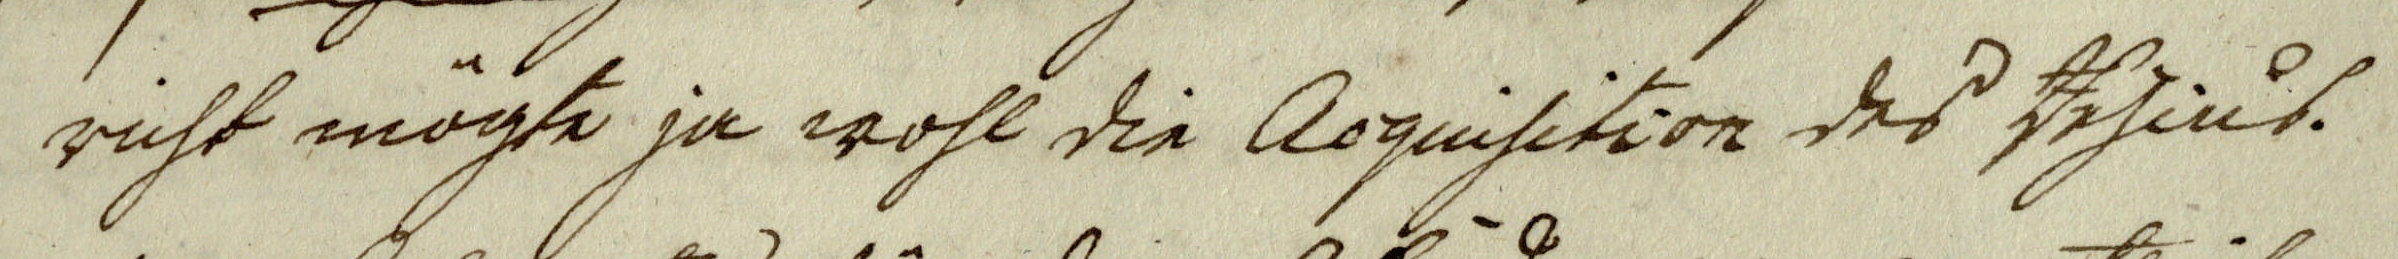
richt mögte ja wohl die Acquisition des Rezius¬
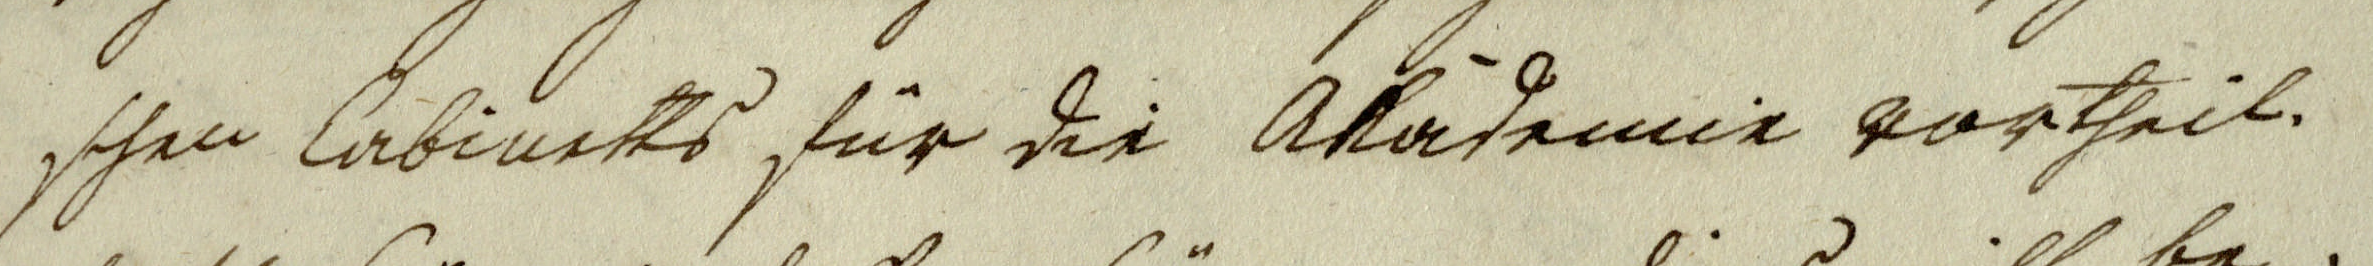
schen Cabinets für die Akademie vortheil¬
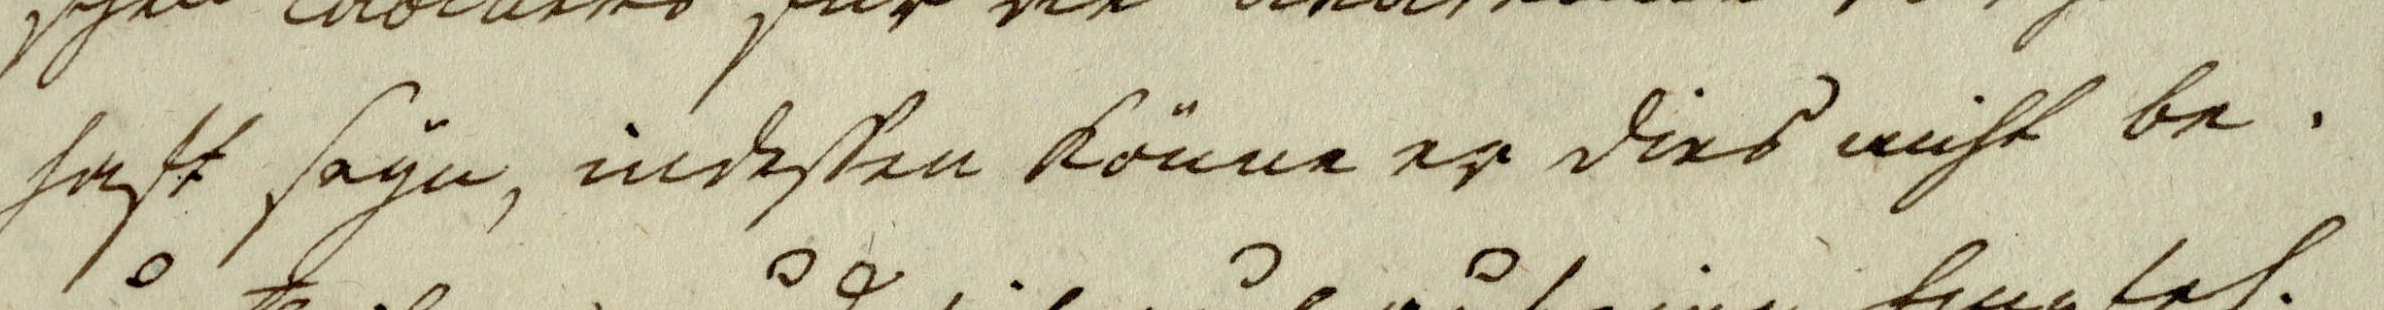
haft seÿn, indessen könne er dies nicht be¬
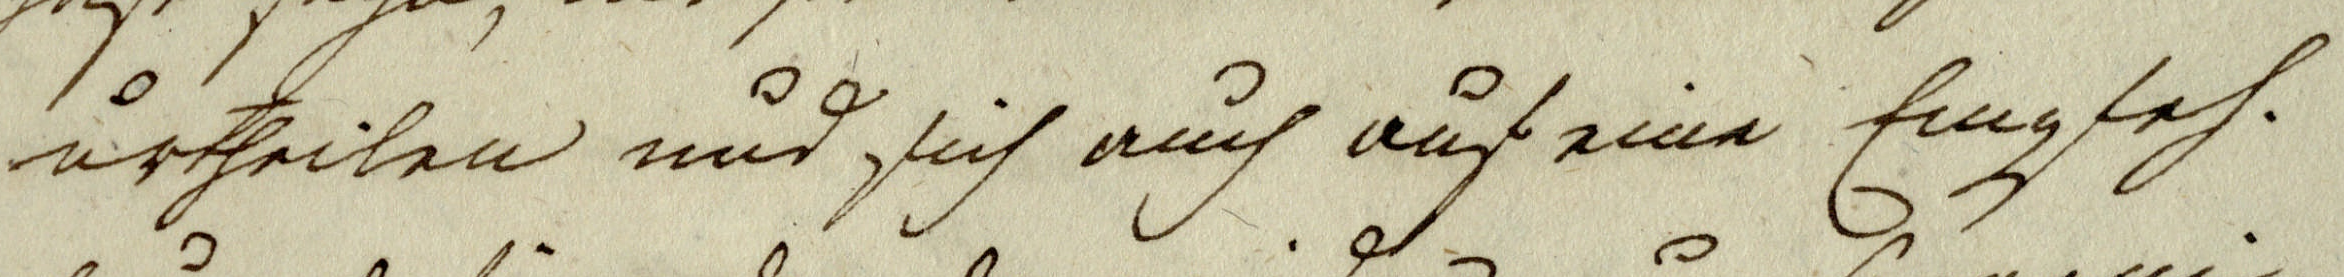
urtheilen und sich auch auf eine Empfeh¬
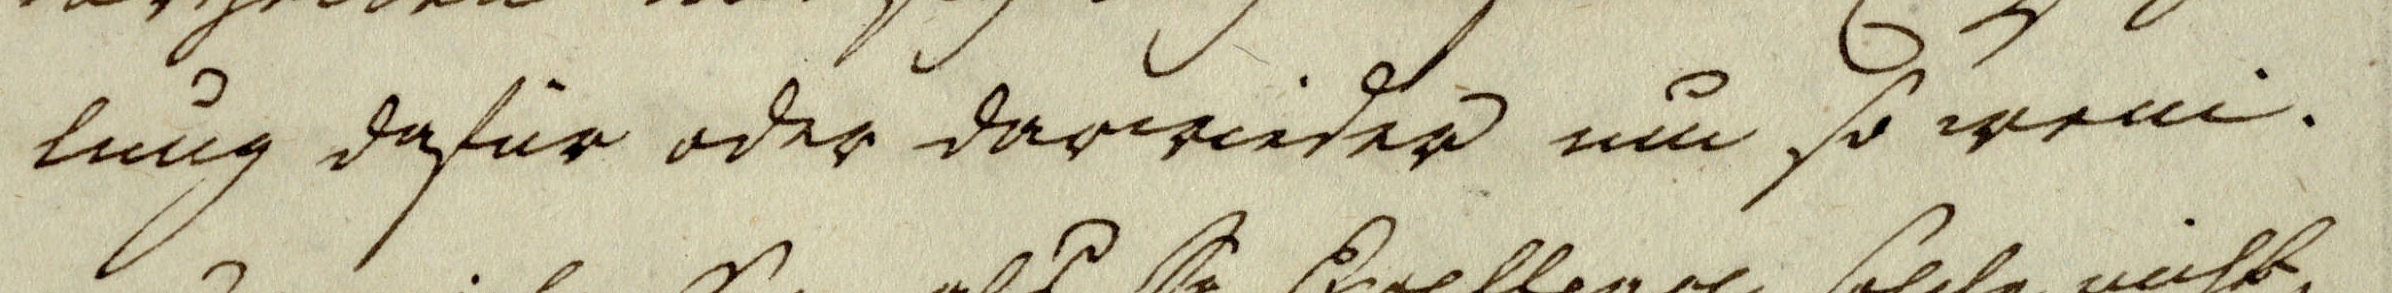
lung dafür oder darwieder um so weni¬
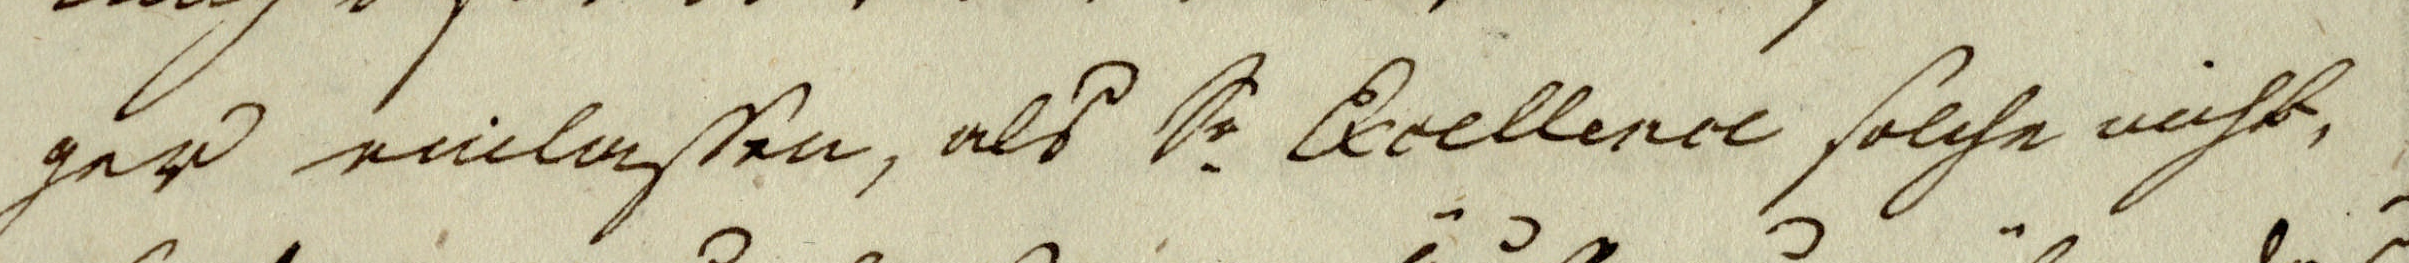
ger einlassen, als Sr Excellence solche nicht,
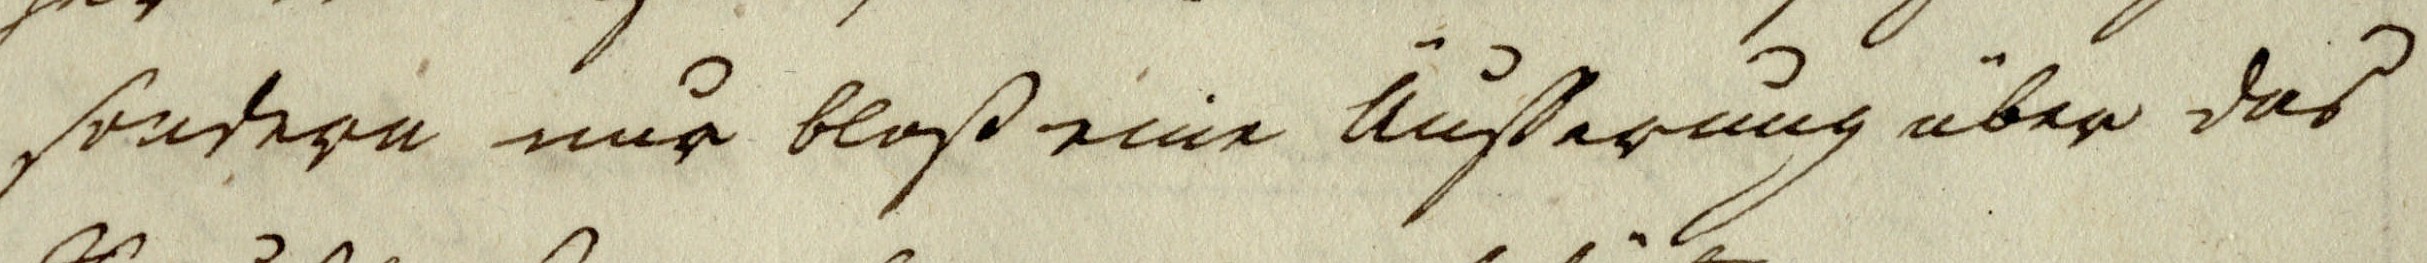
sondern nur bloß eine Äusserung über das
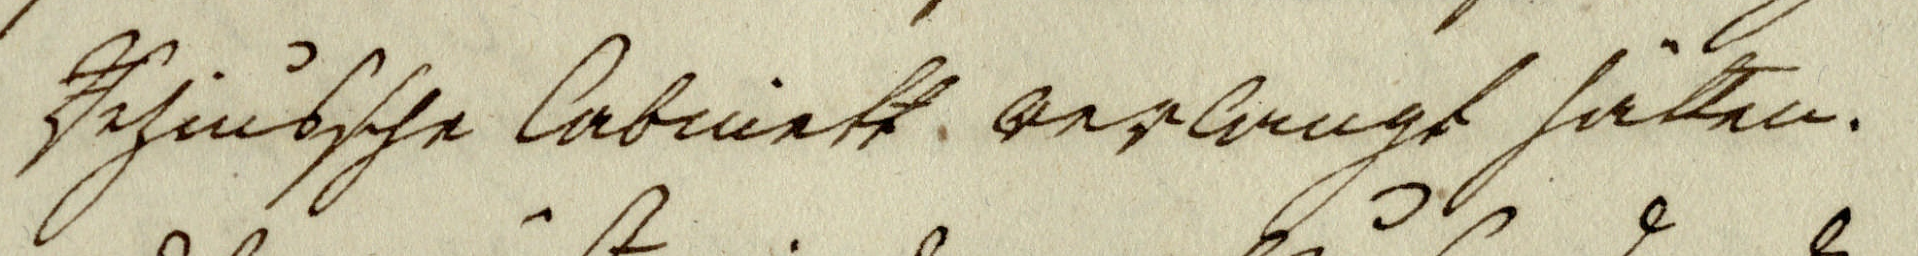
Reziussche Cabinett verlangt hätten.
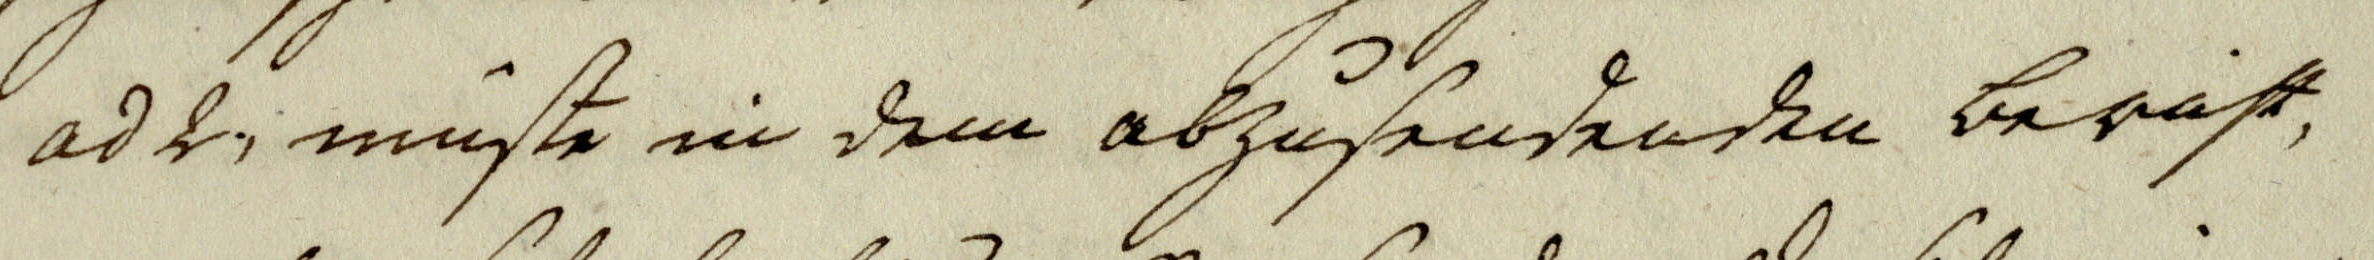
ad 2., müßte in dem abzusendenden Bericht,
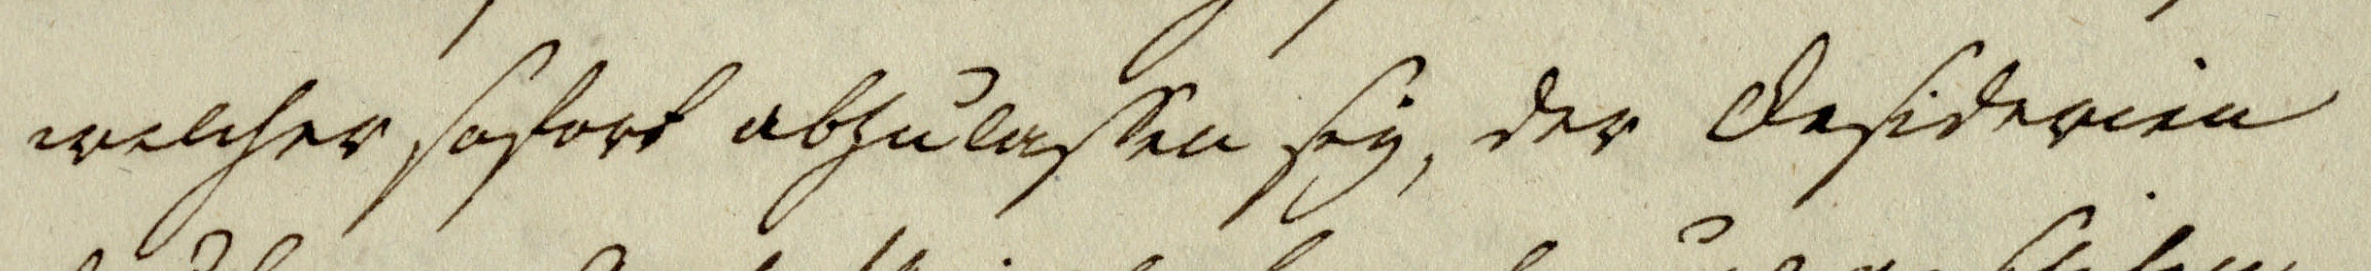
welcher sofort abzulassen seÿ, der Desiderien
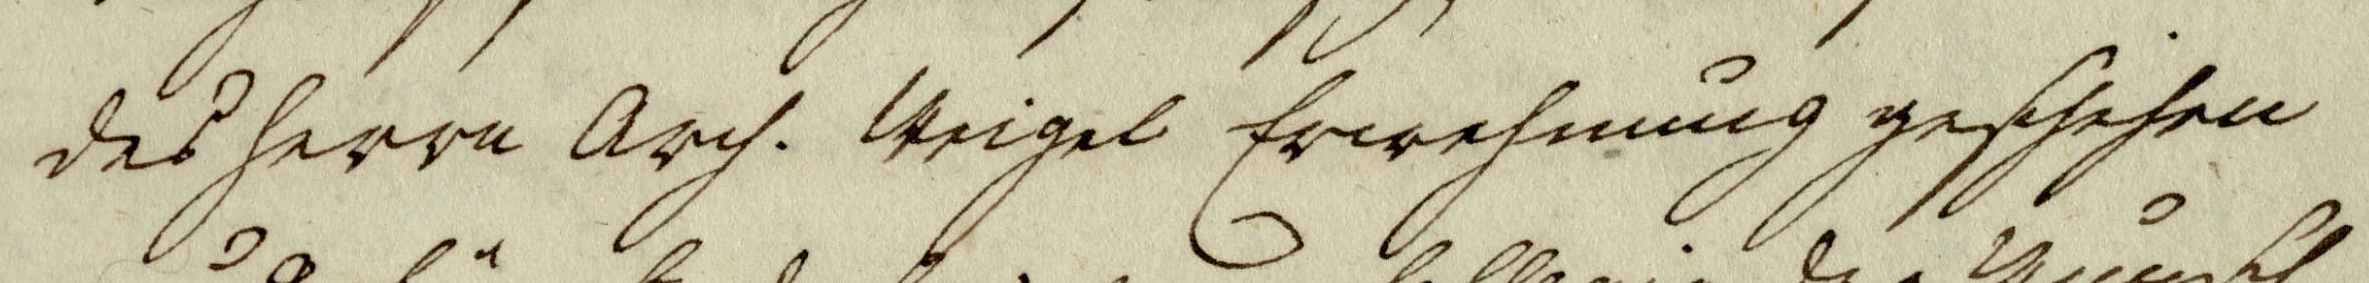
des Herrn Arch. Weigel Erwehnung geschehen
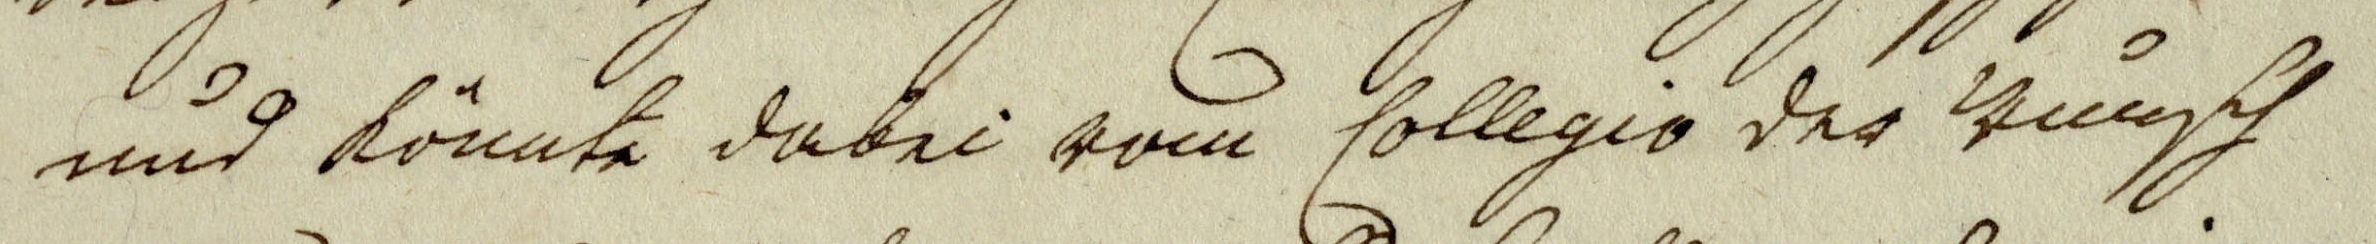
und könnte dabei vom Collegio der Wunsch
